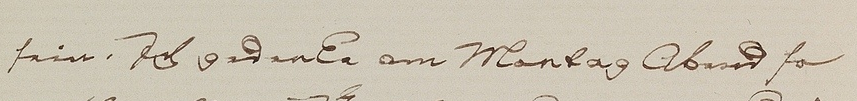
sein. Ich gedenke am Montag Abend so
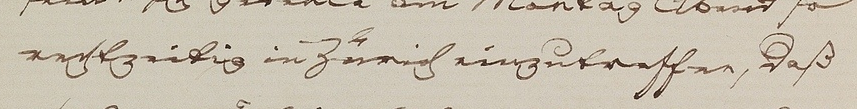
rechtzeitig in Zürich einzutreffen, daß
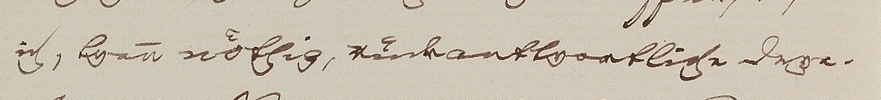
ich, wenn nöthig, rückantwortliche Depe-
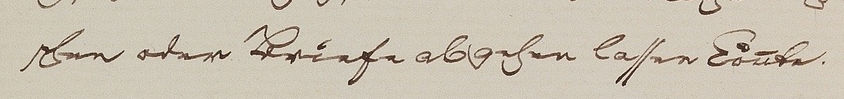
schen oder Briefe abgehen lassen könnte.
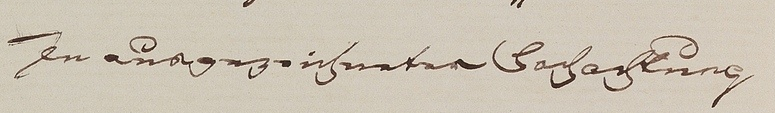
In ausgezeichneter Hochachtung
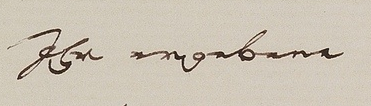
Ihr ergebene
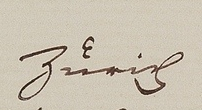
Zürich
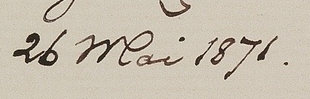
26 Mai 1871.
